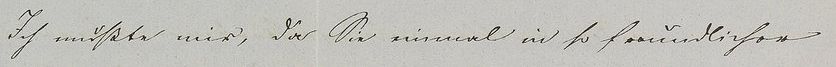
Ich mußte mir, da Sie einmal in so freundlicher
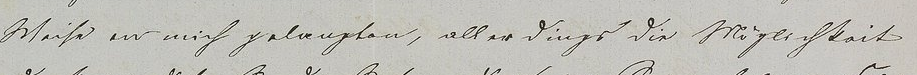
Weise an mich gelangten, allerdings die Möglichkeit
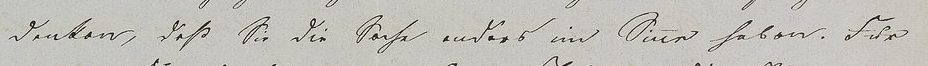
denken, daß Sie die Sache anders im Sinne haben. Für
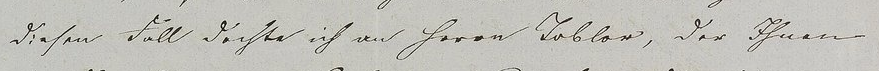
diesen Fall dachte ich an Herrn Tobler, der Ihnen
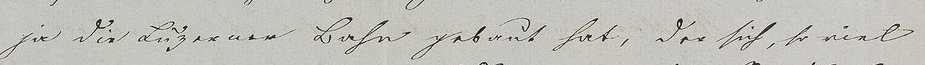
ja die Luzerner Bahn gebaut hat; der sich, so viel
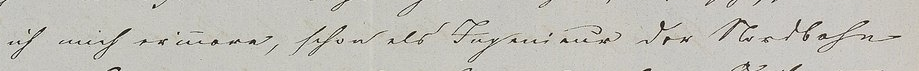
ich mich erinnere, schon als Ingenieur der Nordbahn
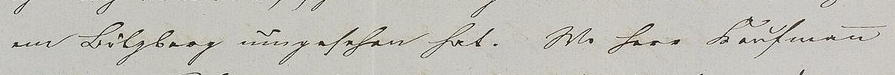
am Bötzberg umgesehen hat. Wo Herr Kaufmann
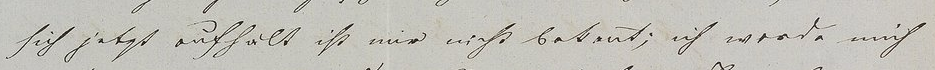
sich jetzt aufhält ist mir nicht bekannt; ich werde mich
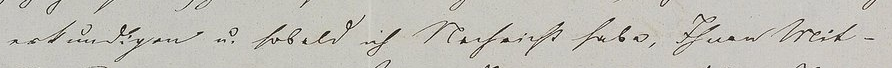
erkundigen u. sobald ich Nachricht habe, Ihnen Mit-
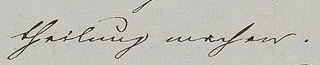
theilung machen.
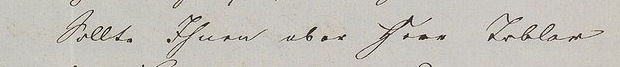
Sollte Ihnen aber Herr Tobler
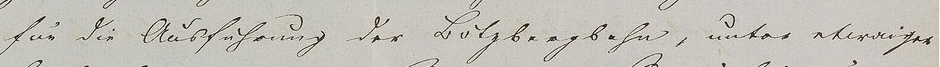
für die Ausführung der Bötzbergbahn, unter etwaiger
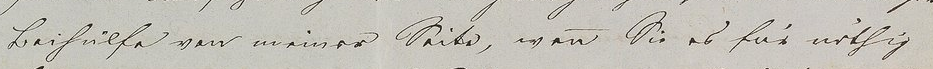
Beihülfe von meiner Seite, wenn Sie es für nöthig
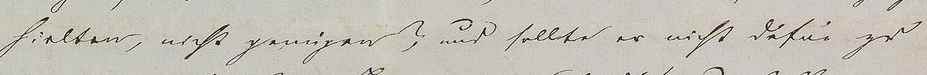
halten, nicht genügen, und sollte er nicht dafür zu
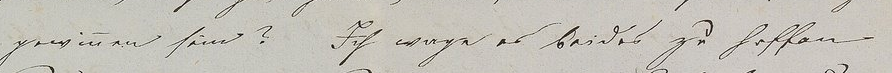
gewinnen sein? Ich wage es beides zu hoffen
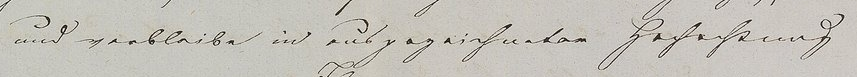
und verbleibe in ausgezeichneter Hochachtung
